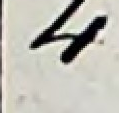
4
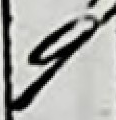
9
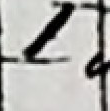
I
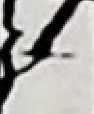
I
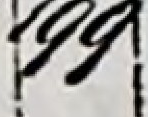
199
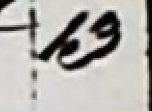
13
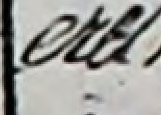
alt
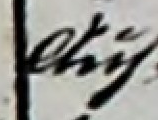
Aus
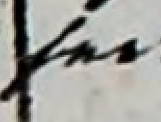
see
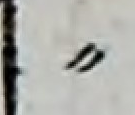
„
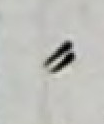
„
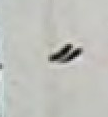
„
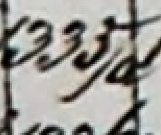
1335/a
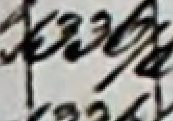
1336/a
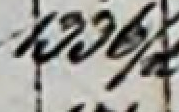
1336/a
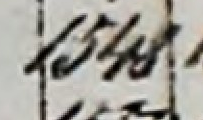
1548
